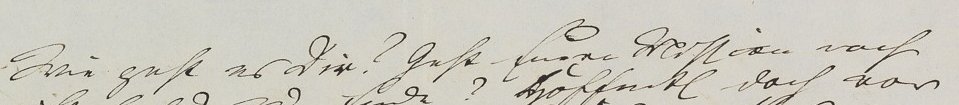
Wie geht es Dir? Geht Euere Mission noch
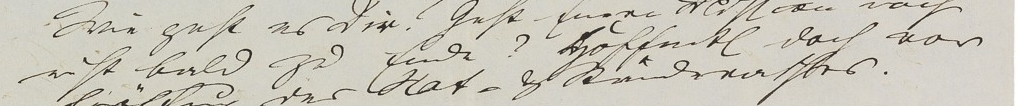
nicht bald zu Ende? Hoffentlich doch vor
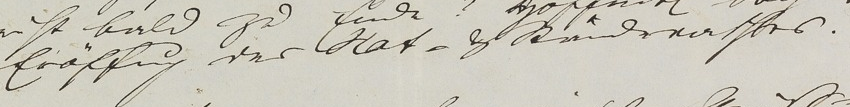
Eröffnung des Nat- & Ständerathes.
